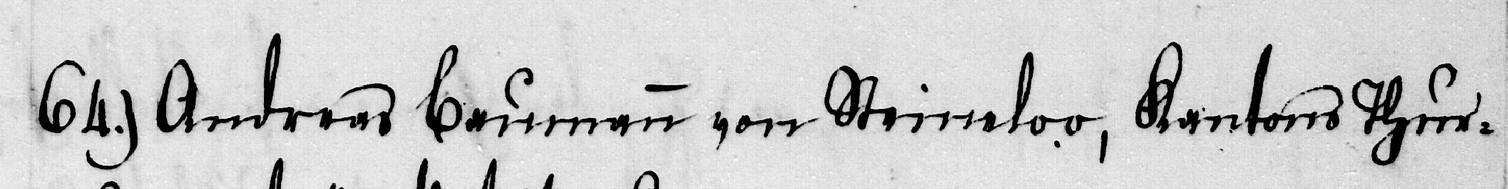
64.) Andreas Baumann von Steineloo, Kantons Thur¬
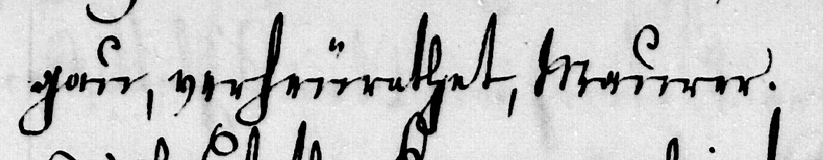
gau, verheurathet, Maurer.
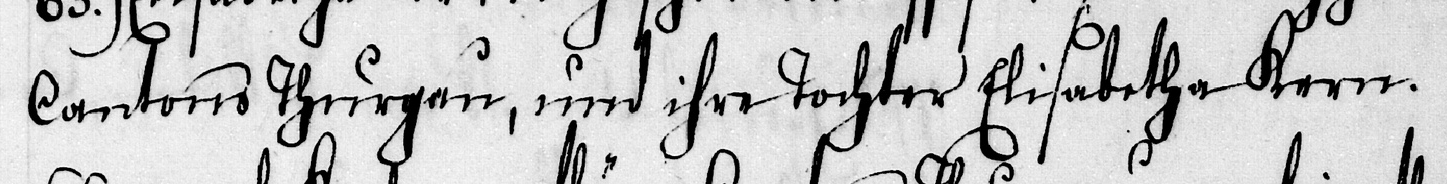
Cantons Thurgau, und ihre Tochter Elisabetha Kern.
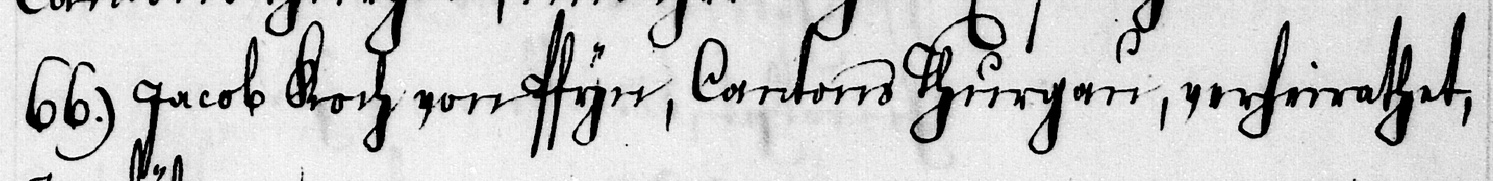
66.) Jacob Koch von Pfyn, Cantons Thurgau, verheirathet,
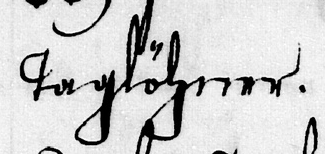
Taglöhner.
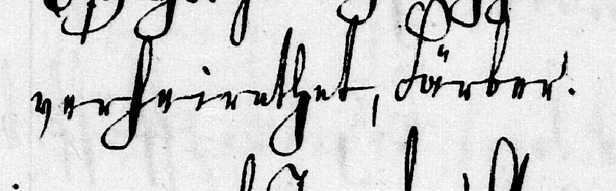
verheirathet, Färber.
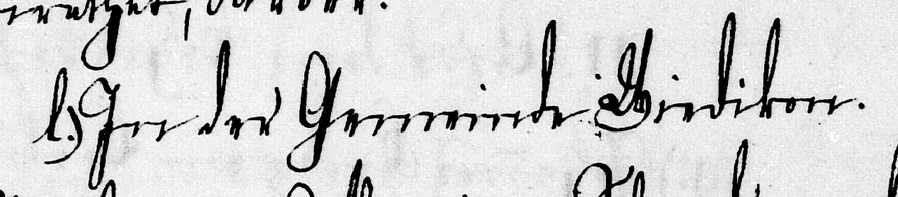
l.) In der Gemeinde Wiedikon.
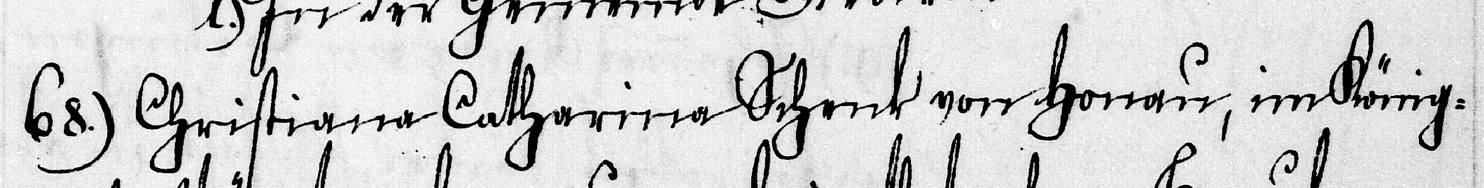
68.) Christiana Catharina Schenk von Honau, im König¬
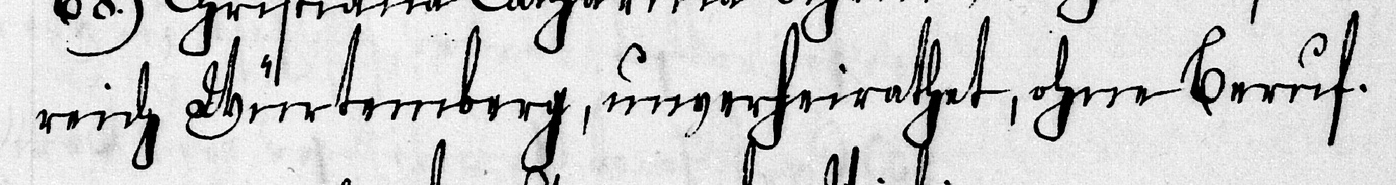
reich Würtemberg, unverheirathet, ohne Beruf.
